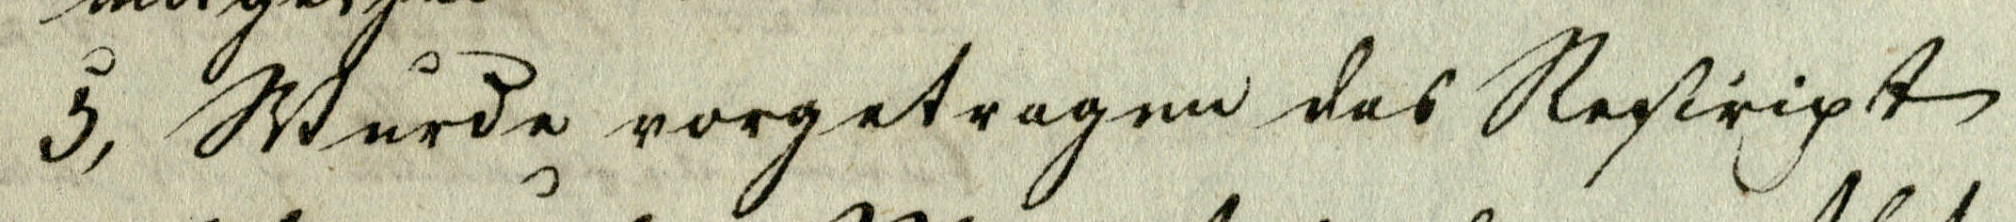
5, Wurde vorgetragen das Rescript
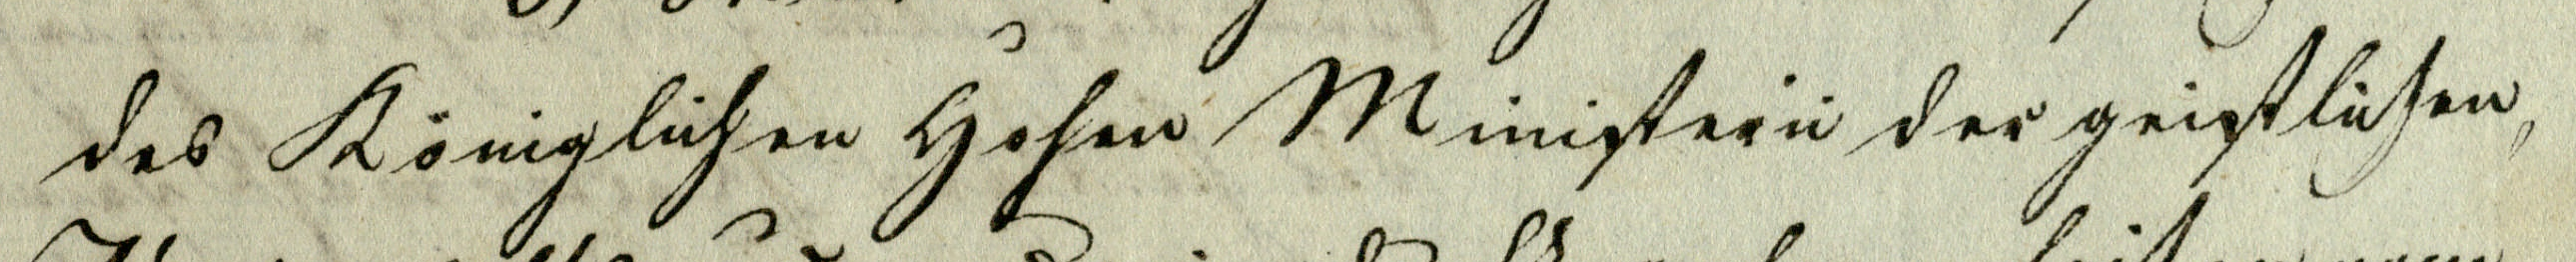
des Königlichen Hohen Ministerii der geistlichen
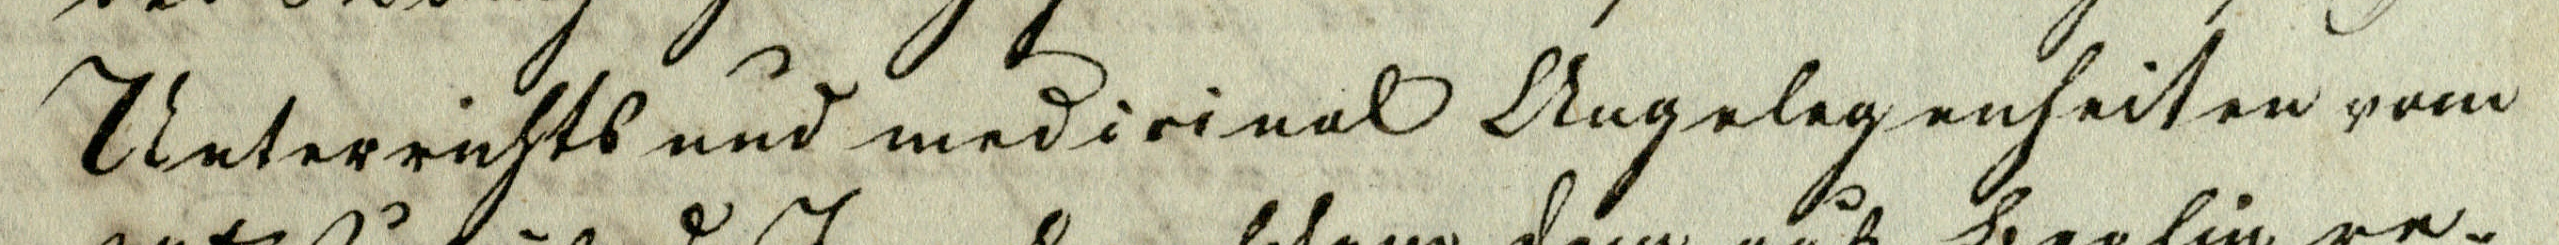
Unterrichts und medicinal Angelegenheiten vom
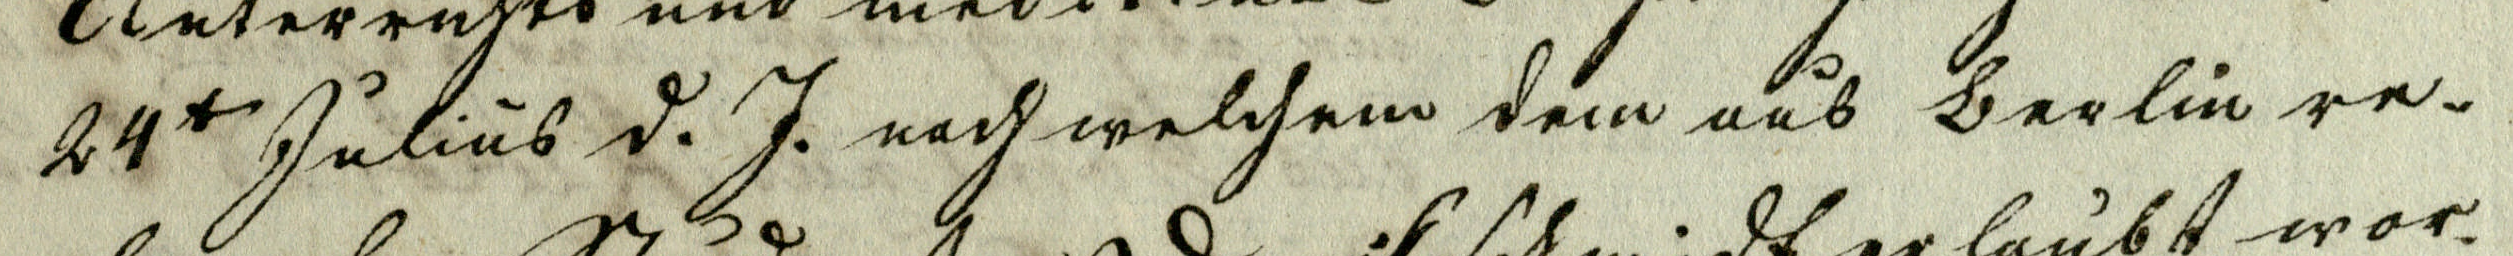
24t Julius d. J. nach welchem dem aus Berlin re¬
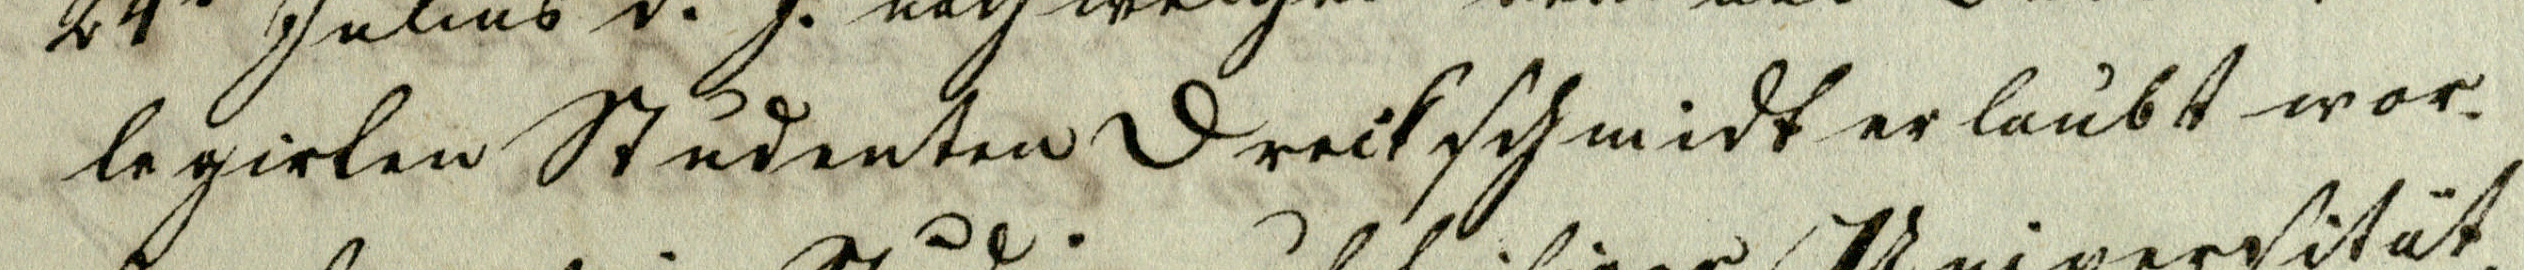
legirten Studenten Dreckschmidt erlaubt wor¬
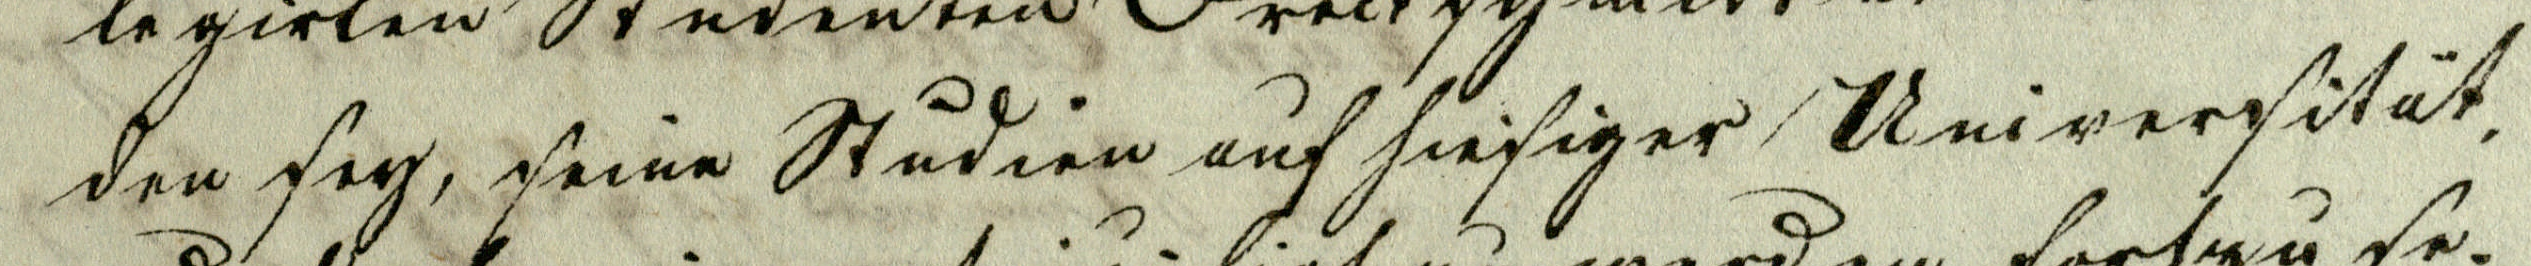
den sey, seine Studien auf hiesiger Universität,
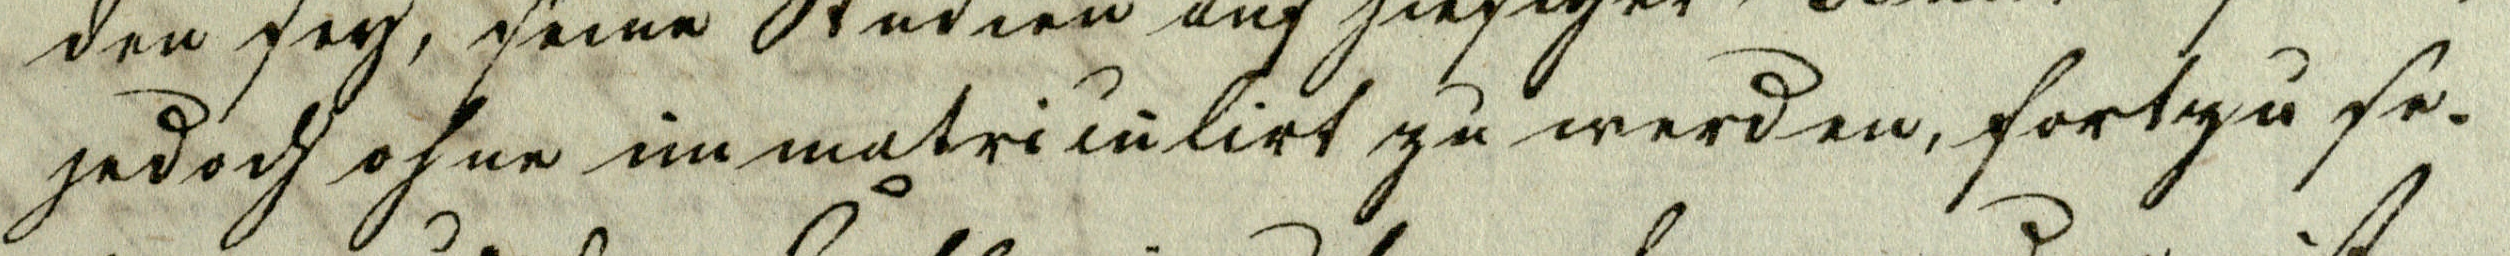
jedoch ohne immatriculirt zu werden, fortzuse¬
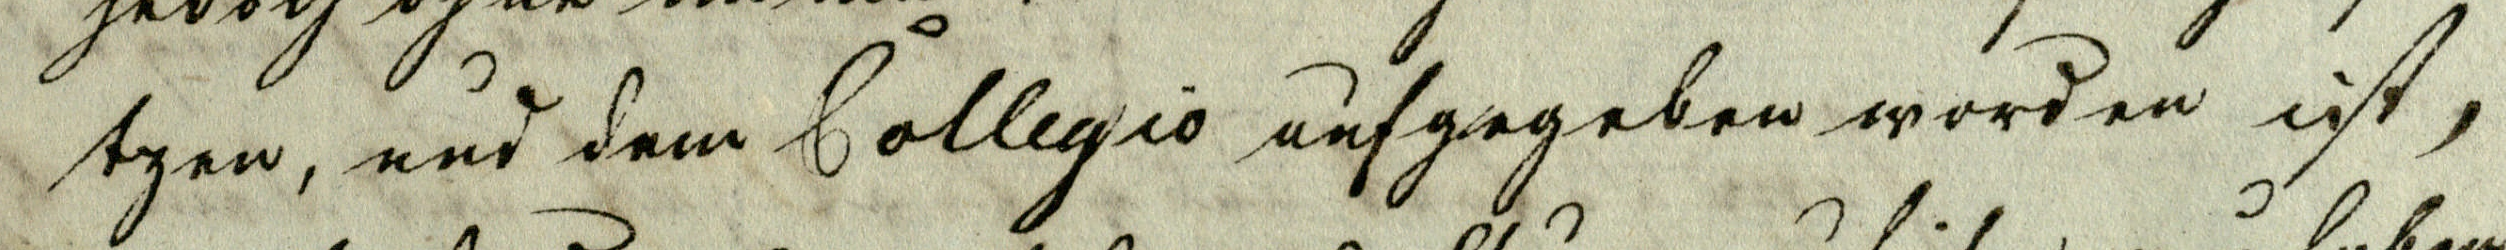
tzen, und dem Collgio aufgegeben worden ist,
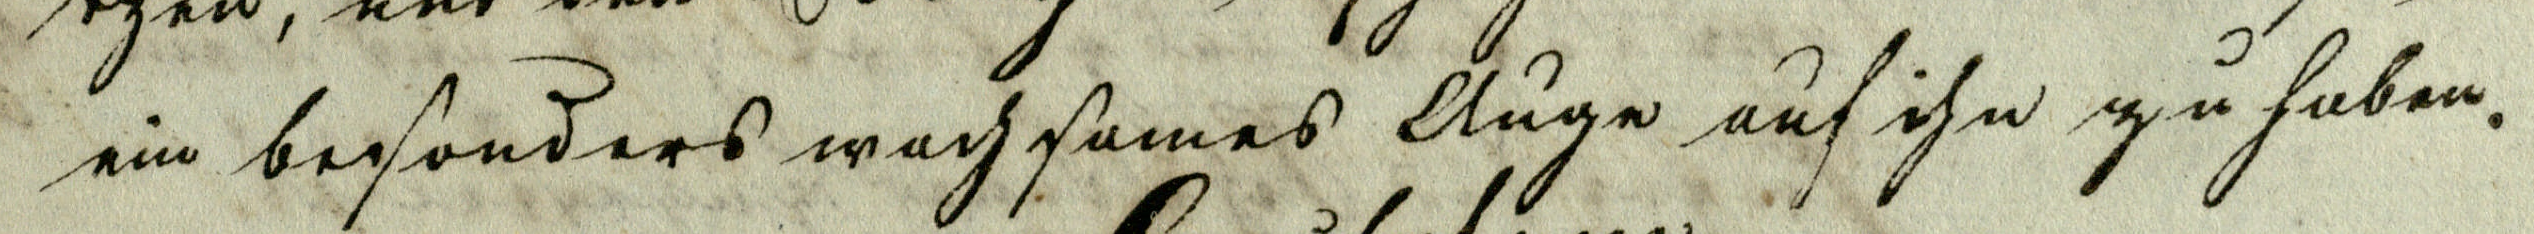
ein besonders wachsames Auge auf ihn zu haben.
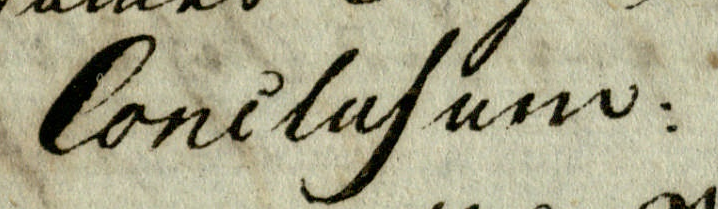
Conclusum:
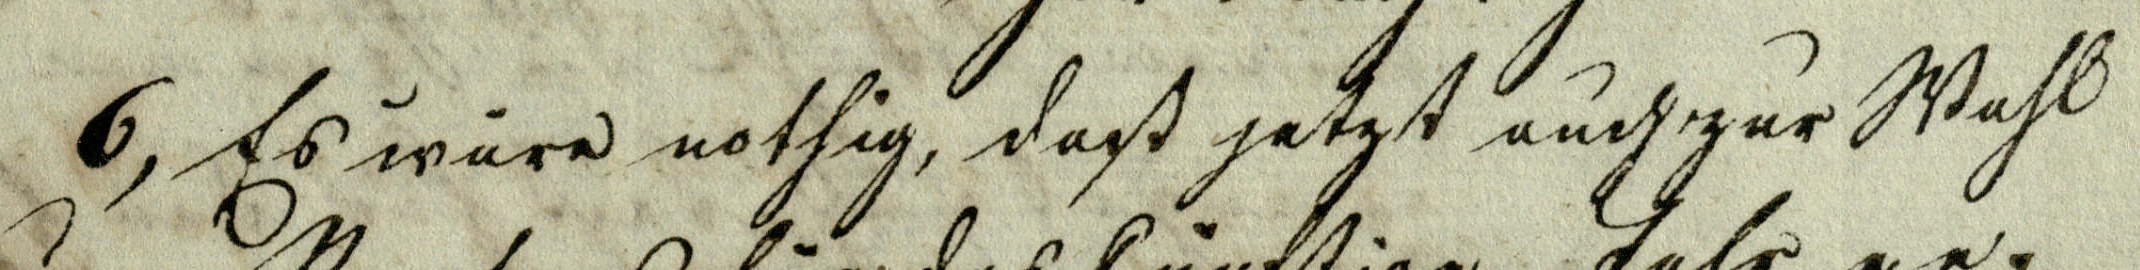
6, Es wäre nöthig, daß jetzt auch zur Wahl
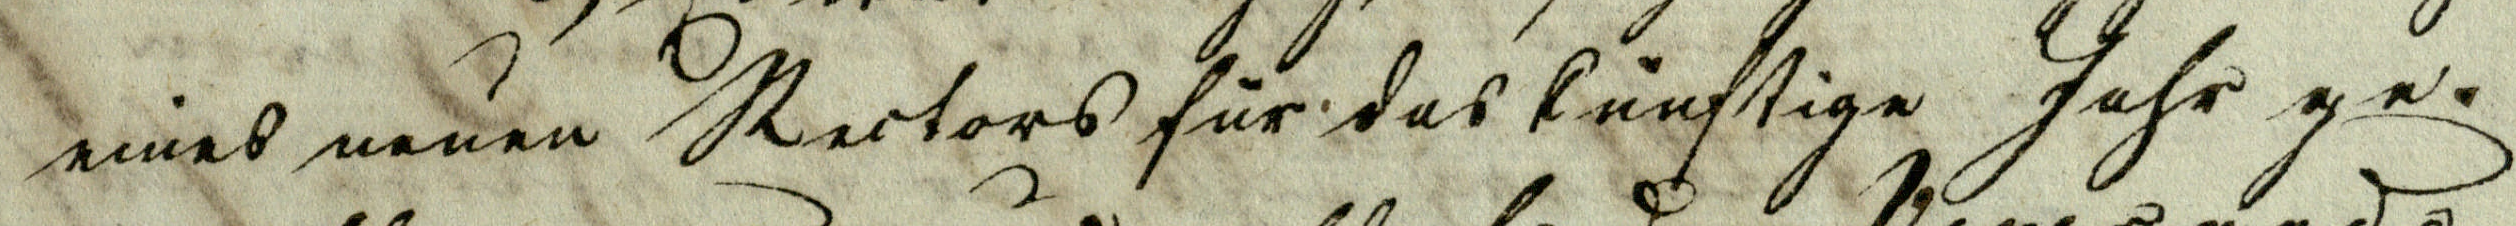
eines neuen Rectors für das künftige Jahr ge¬
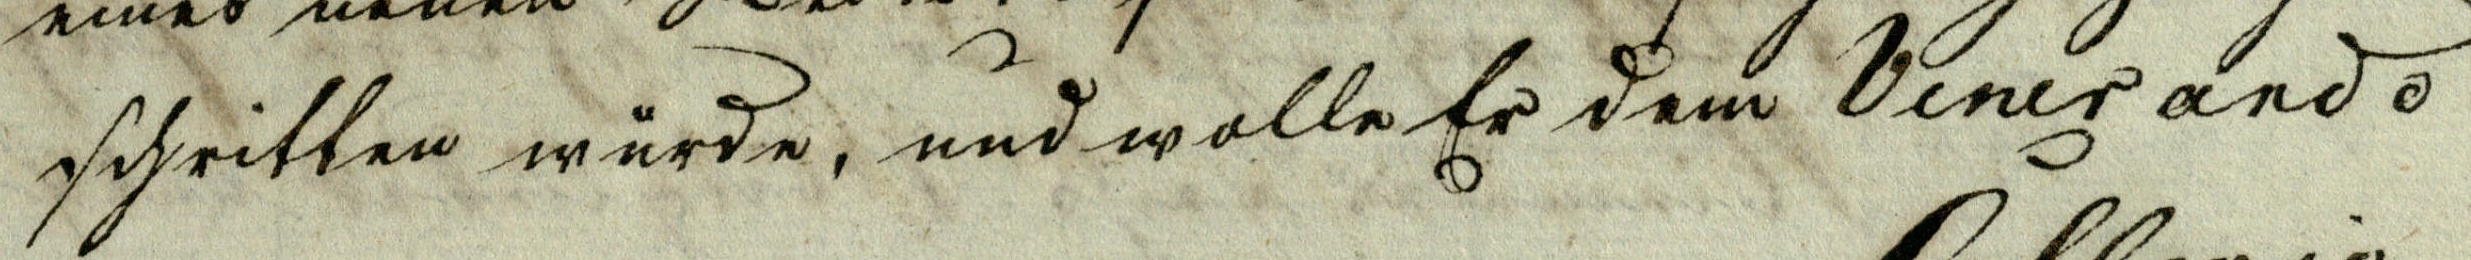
schritten würde, und wolle Er dem Venerando
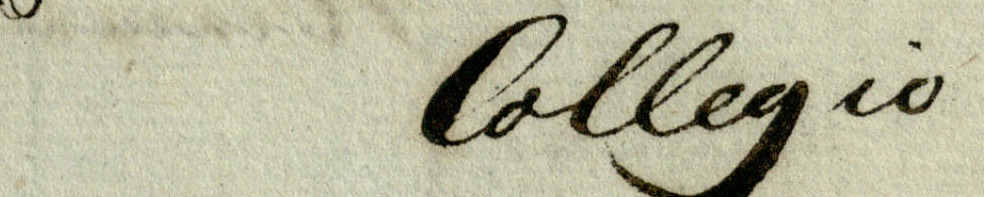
Collegio
